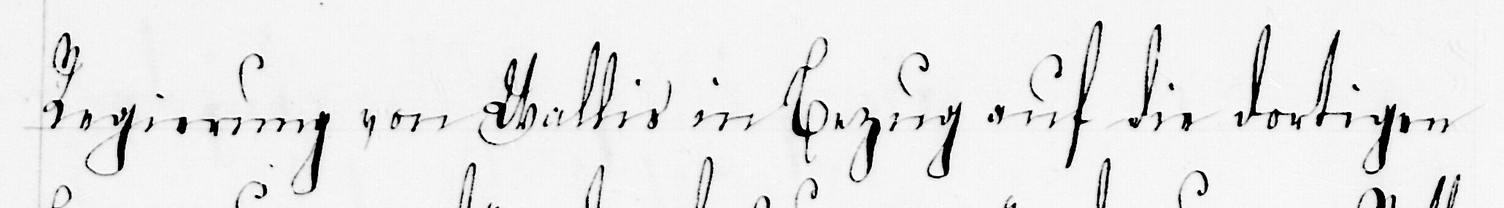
Regierung von Wallis in Bezug auf die dortigen
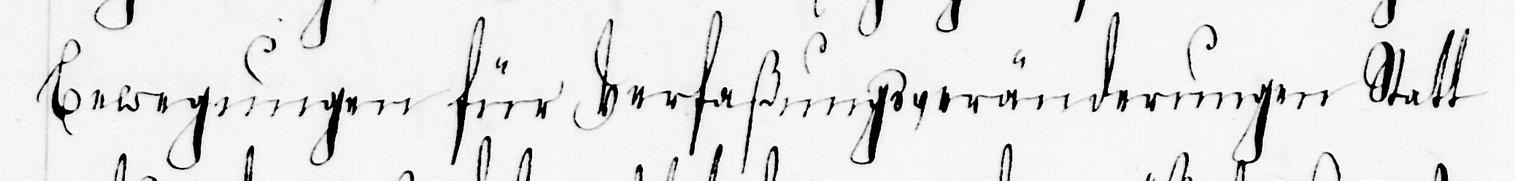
Bewegungen für Verfaßungsveränderungen Statt
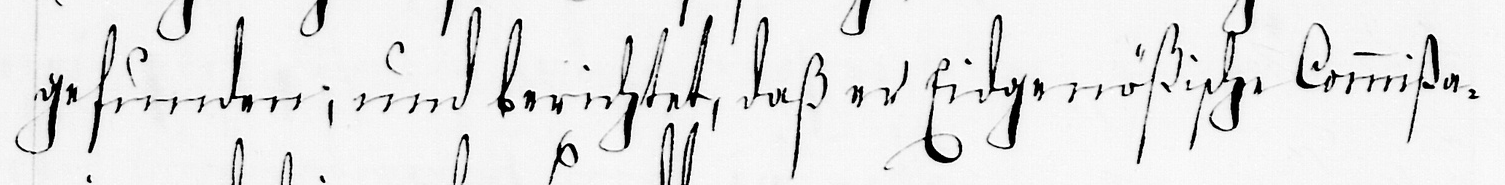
gefunden; und berichtet, daß er Eidgenößische Commißa¬
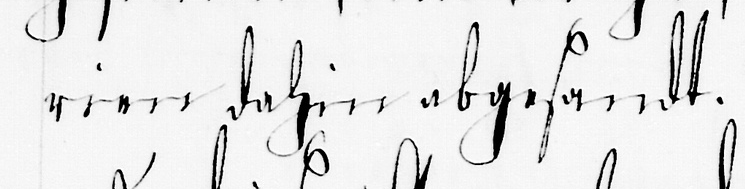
rien dahin abgesandt.
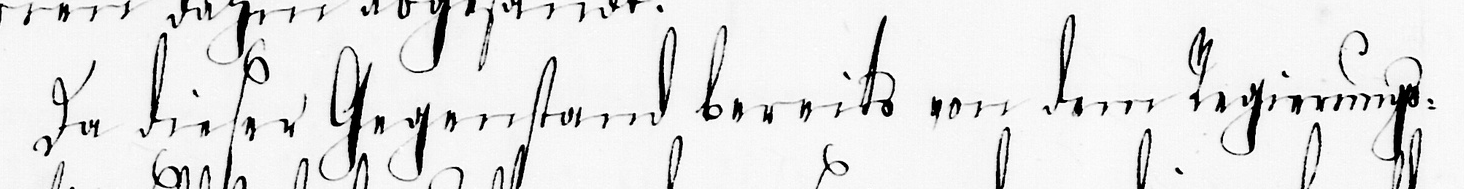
Da dieser Gegenstand bereits von dem Regierungs¬
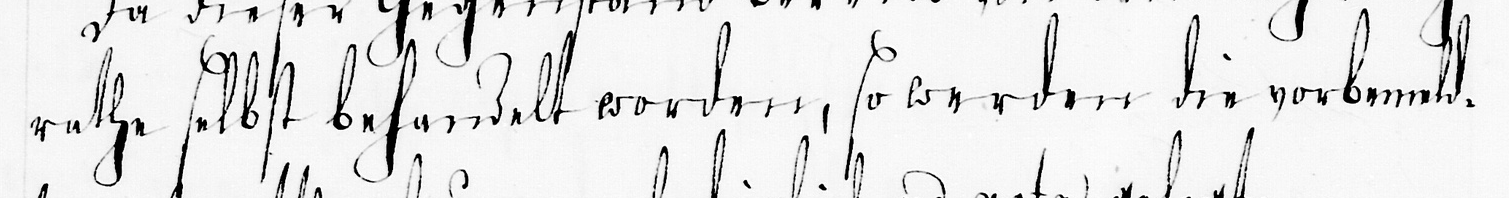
rathe selbst behandelt worden, so werden die vorbemerk¬
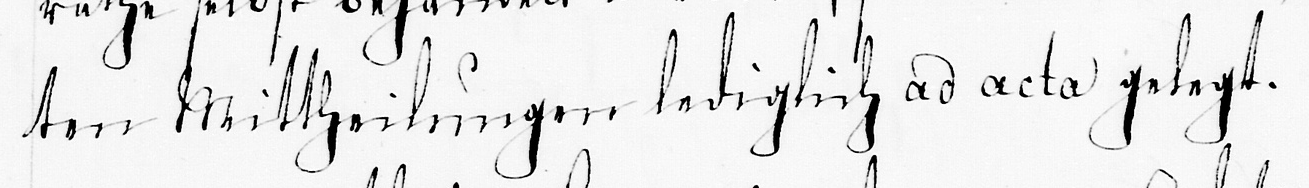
ten Mittheilungen lediglich ad acta gelegt.
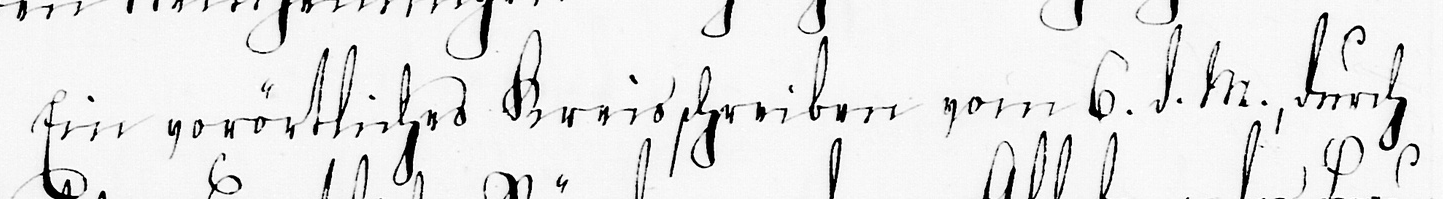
Ein vorörtliches Kreisschreiben vom 6. d. M., durch
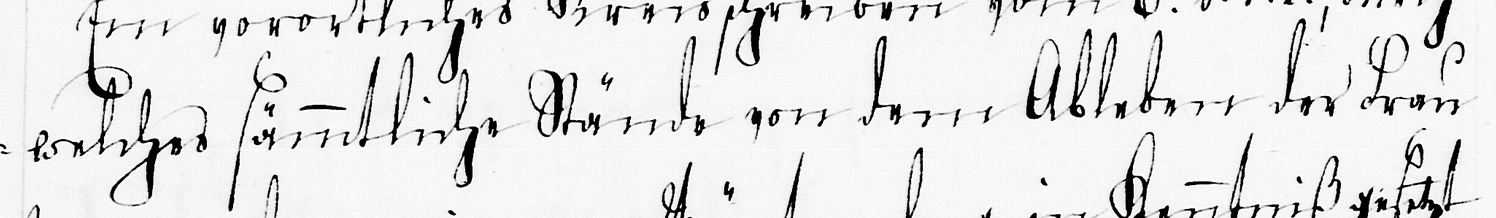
welches sämmtliche Stände von dem Ableben der Frau
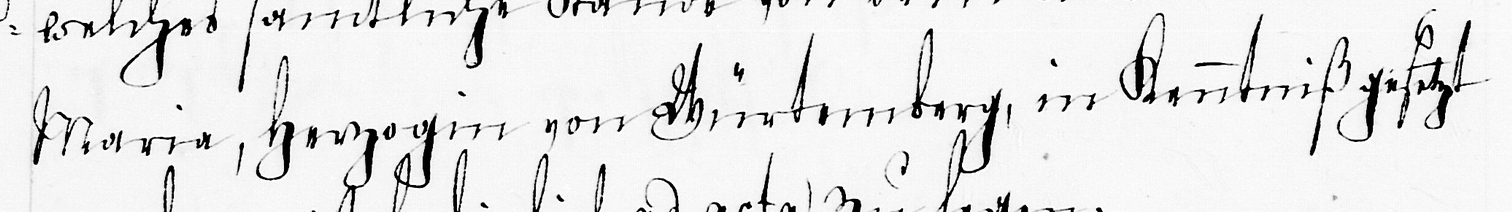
Maria, Herzogin von Würtemberg, in Kenntniß gesetzt
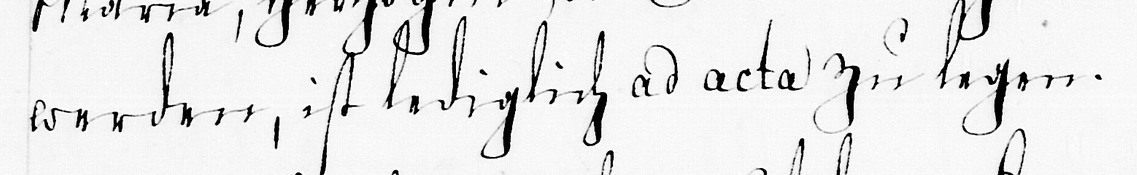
werden, ist lediglich ad acta zu legen.
